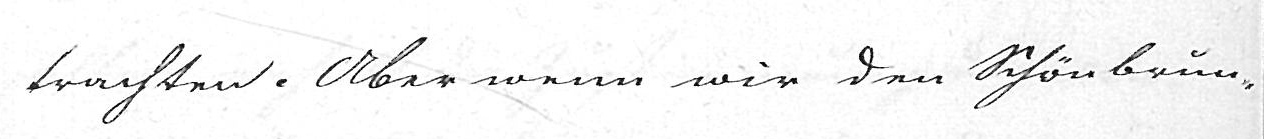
trachten. Aber wenn wir den Schönbrun-
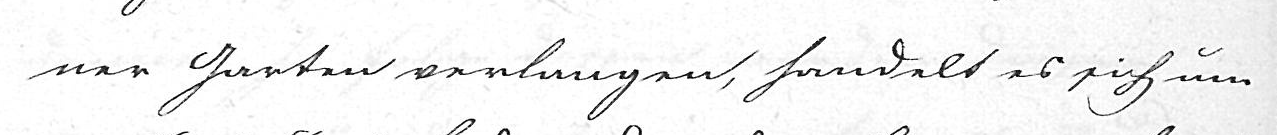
ner Garten verlangen, handelte es sich um
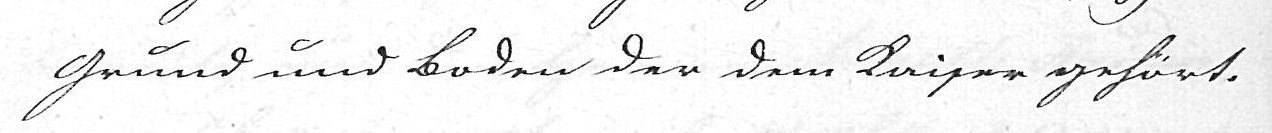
Grund und Boden der dem Kaiser gehört.
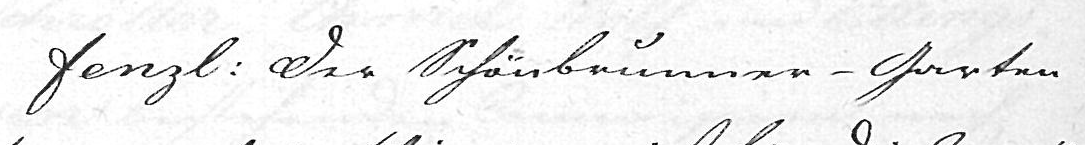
Fenzl: Der Schönbrunner-Garten
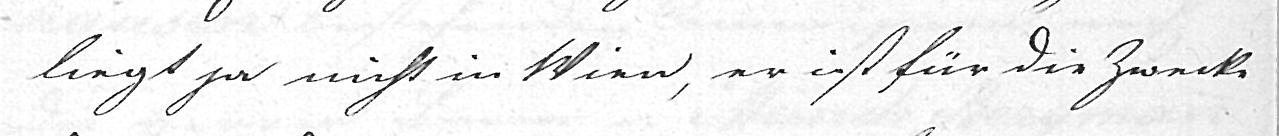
liegt ja nicht in Wien, er ist für die Zwecke
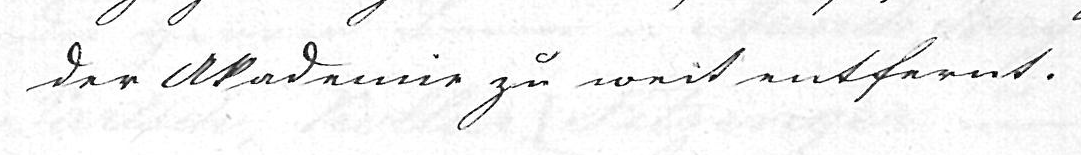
der Akademie zu weit entfernt.
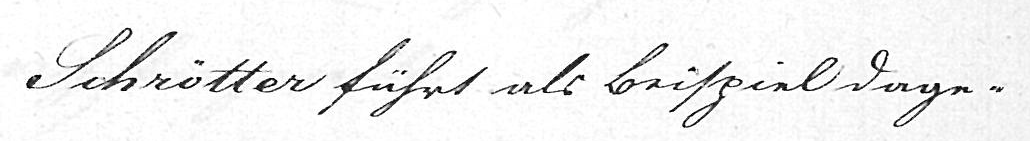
Schrötter führt als Beispiel dage-
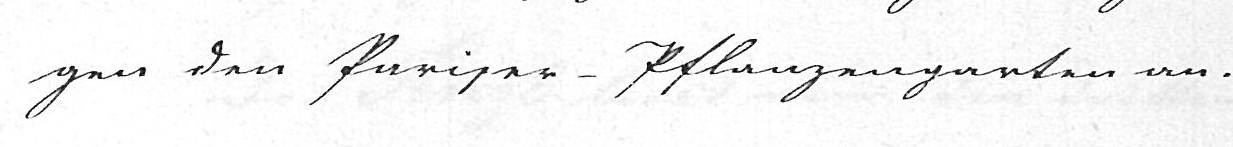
gen den Pariser-Pflanzengarten an.
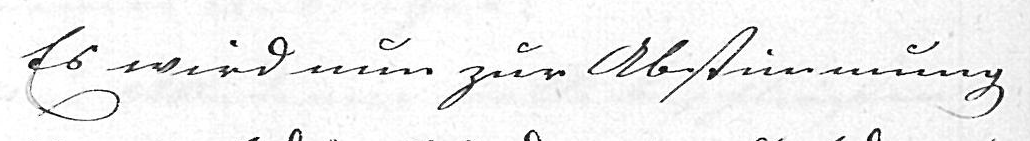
Es wird nun zur Abstimmung
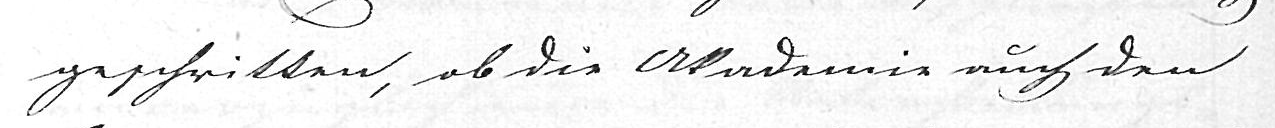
geschritten, ob die Akademie auch den
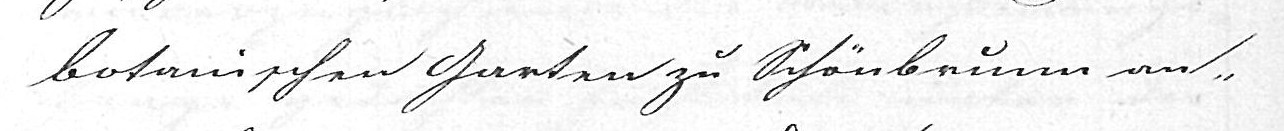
botanischen Garten zu Schönbrunn an-
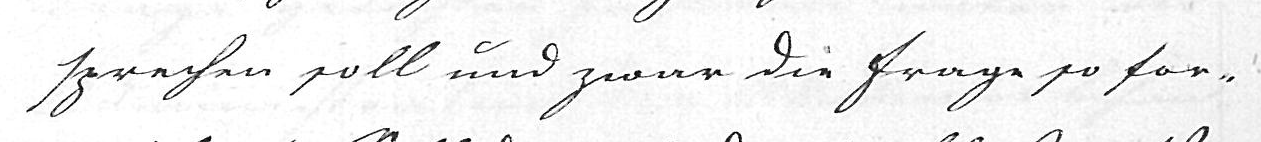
sprechen soll und zwar die Frage so for-
